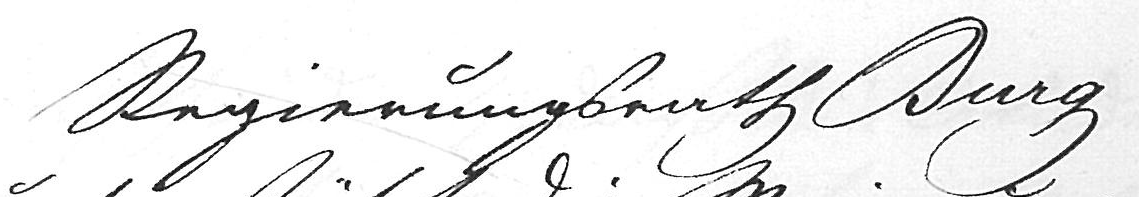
Regierungsrath Burg
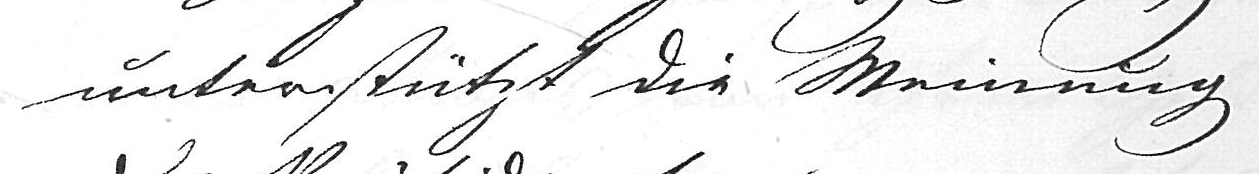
unterstützt die Meinung
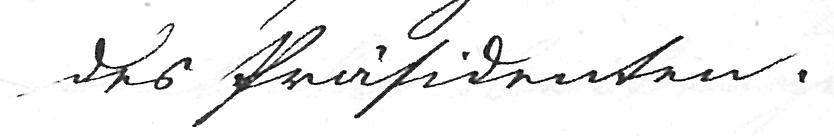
des Präsidenten.
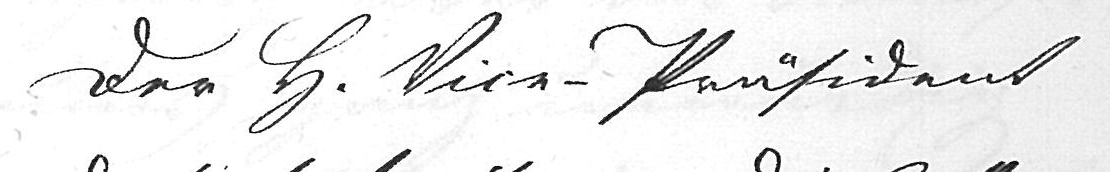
Der H. Vice-Präsident
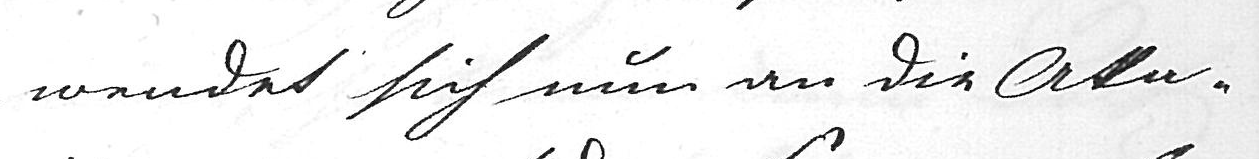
wendet sich nun an die Aka-
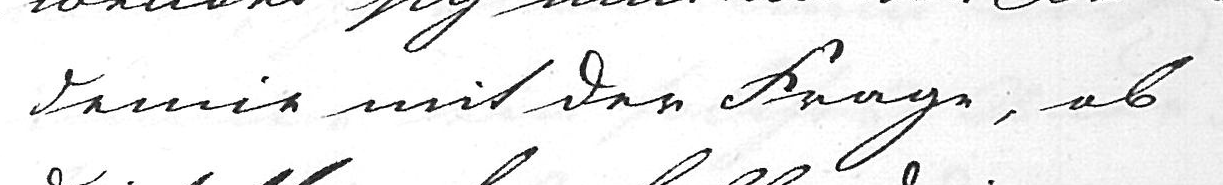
demie mit der Frage, ob
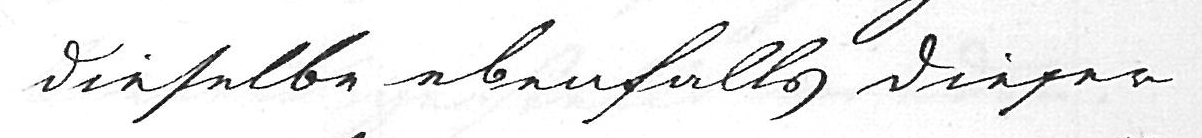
dieselbe ebenfalls dieser
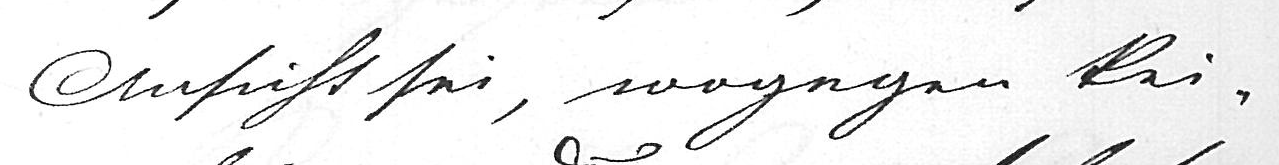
Ansicht sei, wogegen kei-
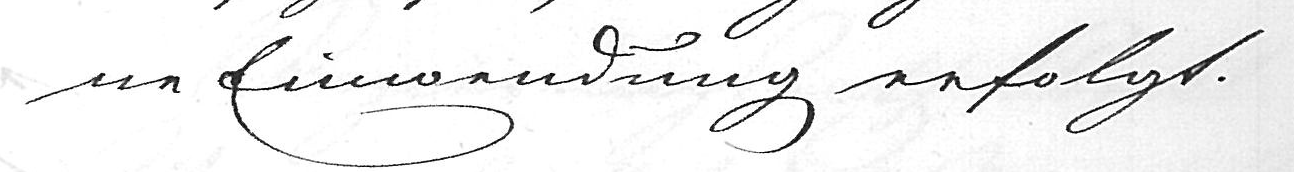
ne Einwendung erfolgt.
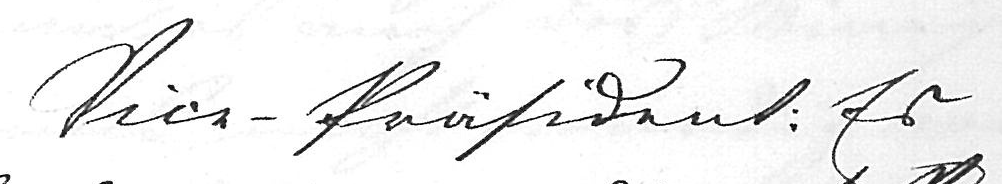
Vice-Präsident: Es
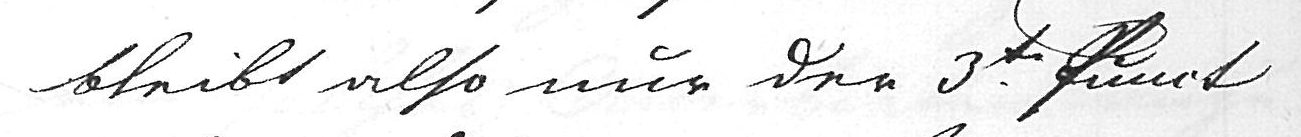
bleibt also nur der 3te Punct
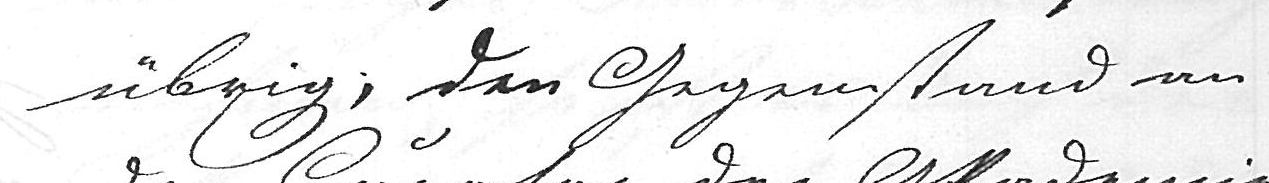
übrig den Gegenstand an
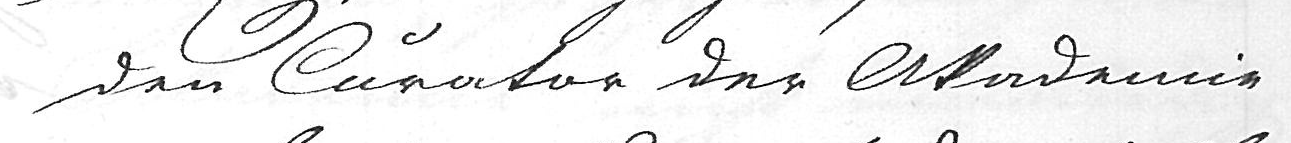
den Curator der Akademie
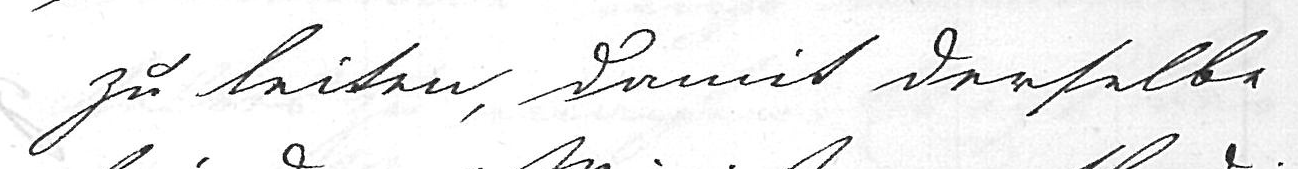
zu leiten, damit derselbe
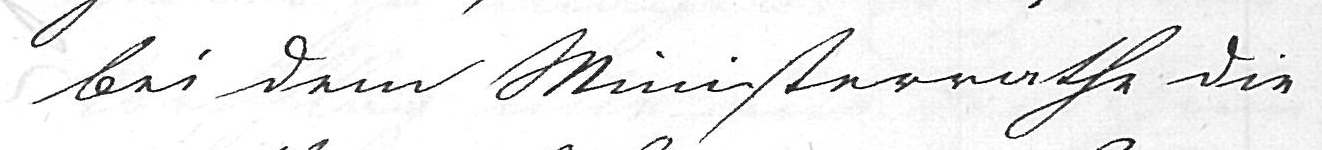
bei dem Ministerrathe die
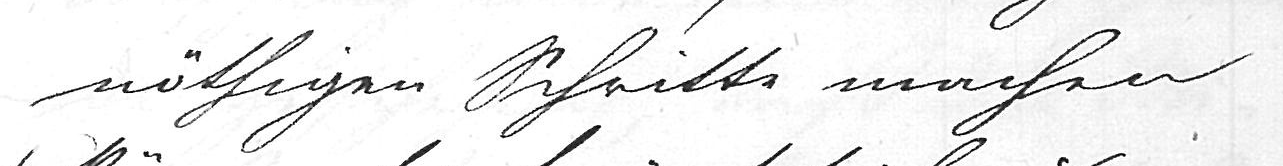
nöthigen Schritte machen
